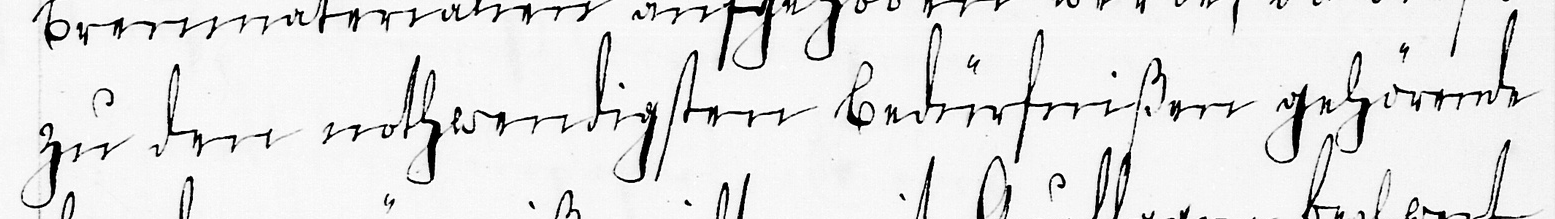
zu den nothwendigsten Bedürfnißen gehörende
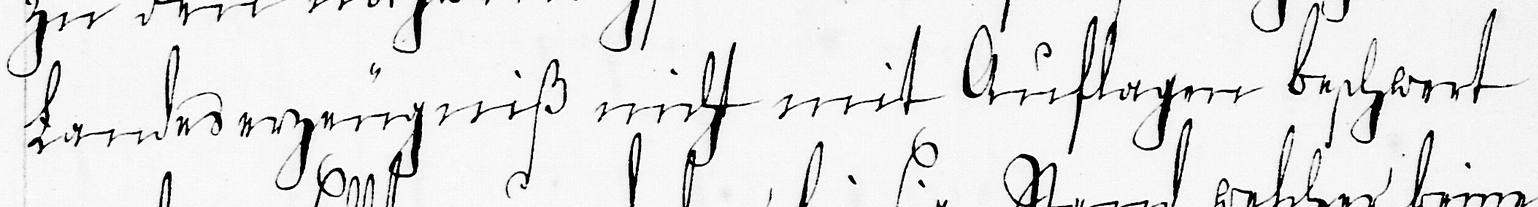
Landeserzeugniß nicht mit Auflagen beschwert
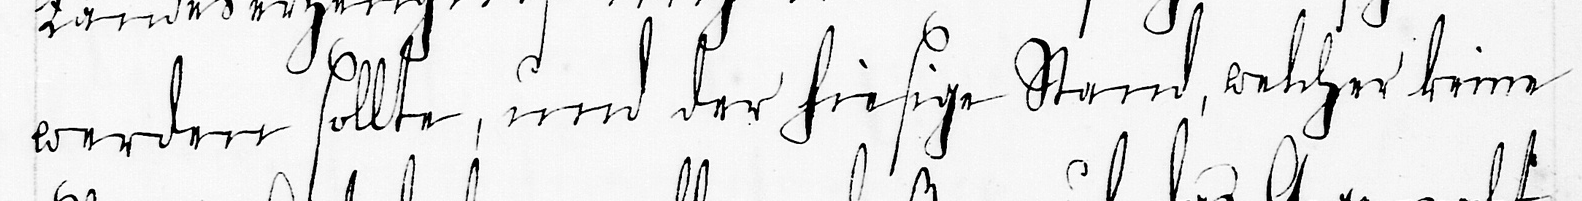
werden sollte, und der hiesige Stand, welcher keine
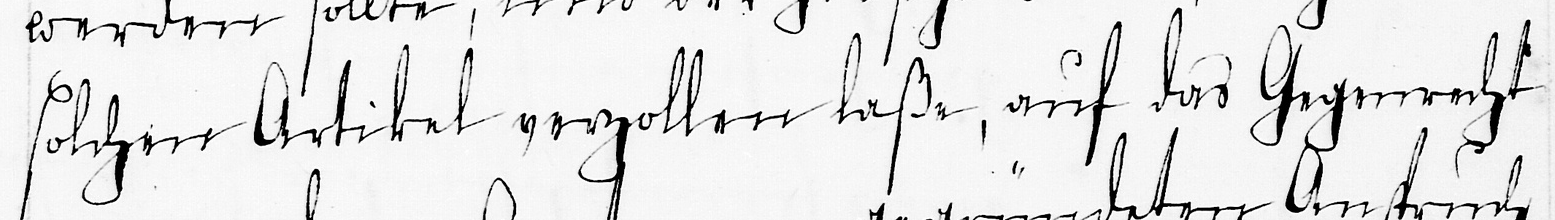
solchen Artikel verzollen laße, auf das Gegenrecht
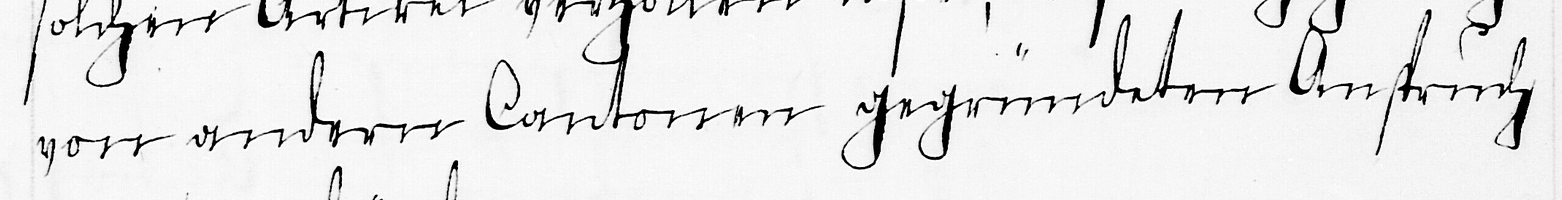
von andern Cantonen gegründeten Anspruch
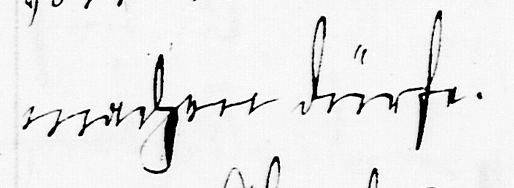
machen dürfe.
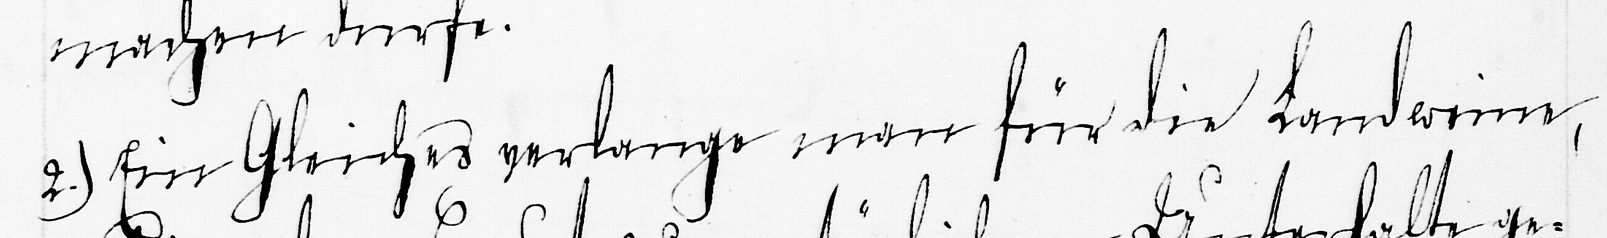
2.) Ein Gleiches verlange man für die Landweine,
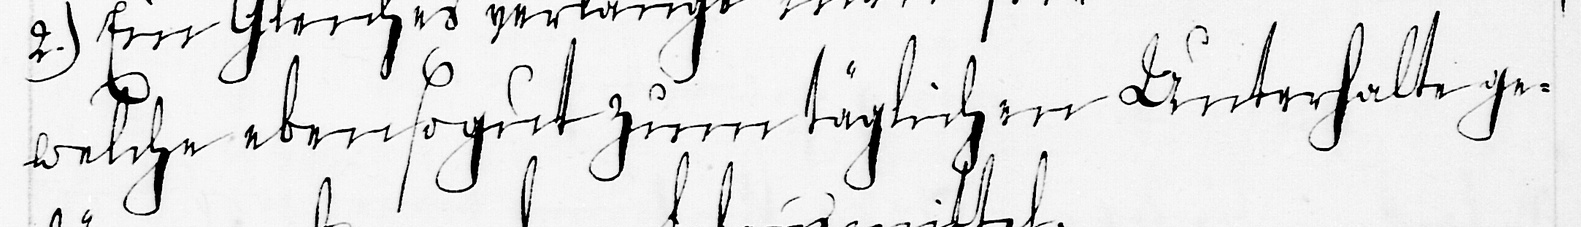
welche ebensogut zum täglichen Unterhalte ge¬
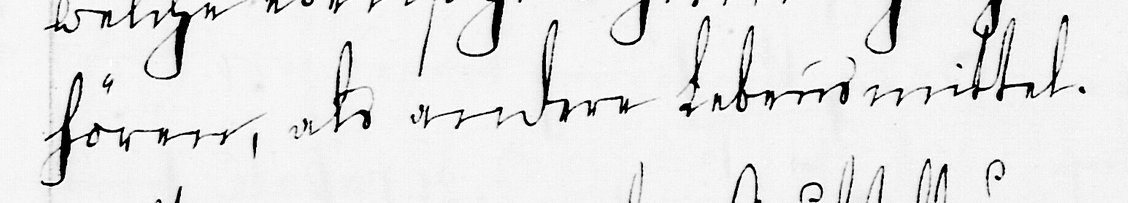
hören, als andere Lebensmittel.
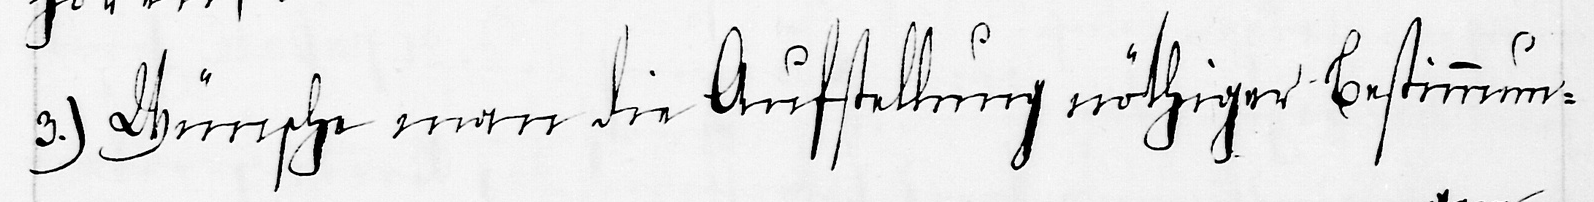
3.) Wünsche man die Aufstellung nöthiger Bestimmun-
